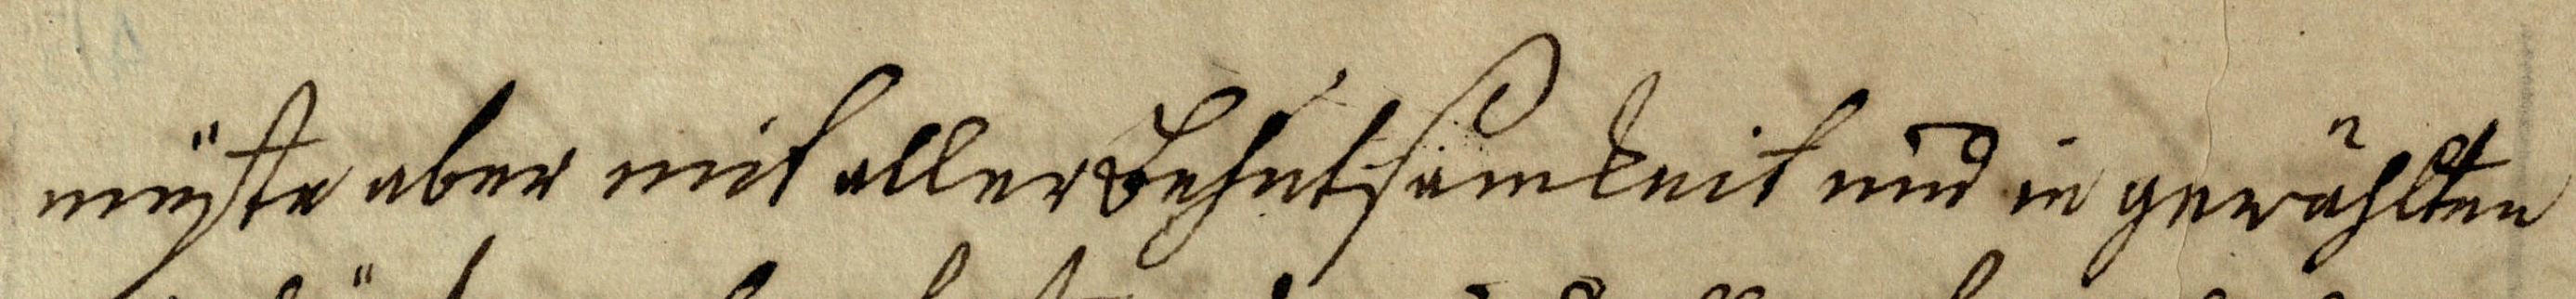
müßte aber mit aller Behutsamkeit und in gerwählten
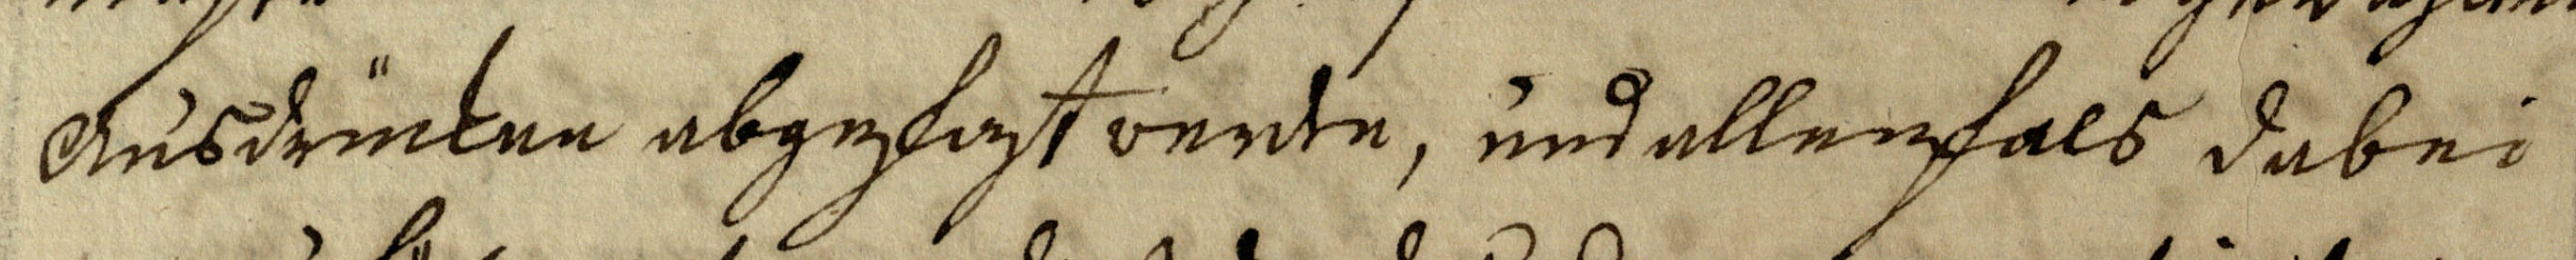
Ausdrücken abgefast werden, und allenfalls dabei
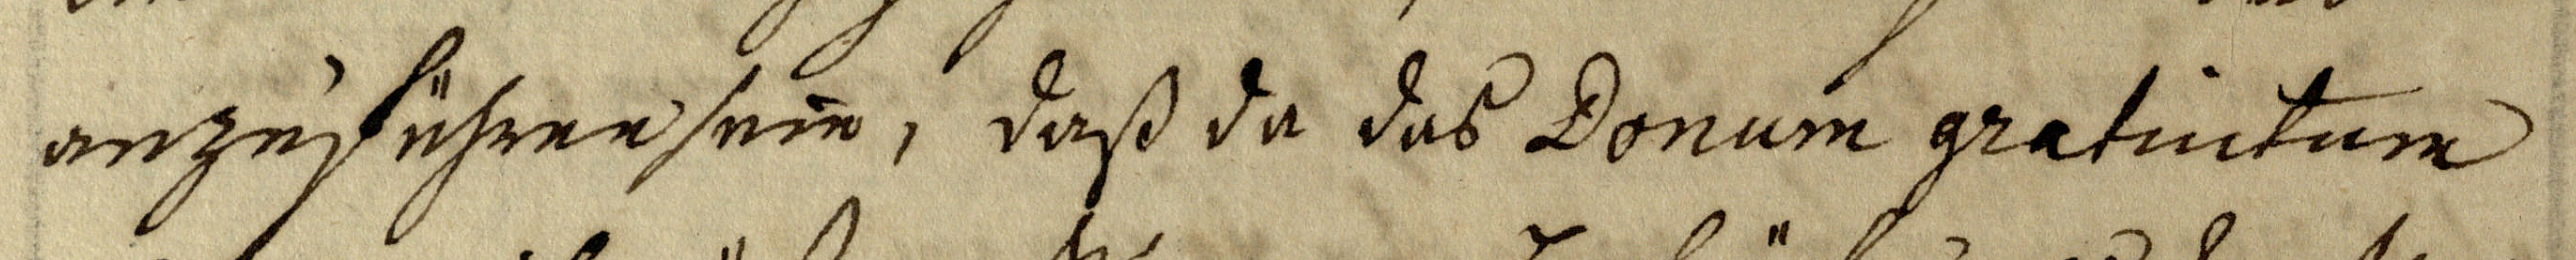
anzuführen sein, daß da das Donum gratuitum
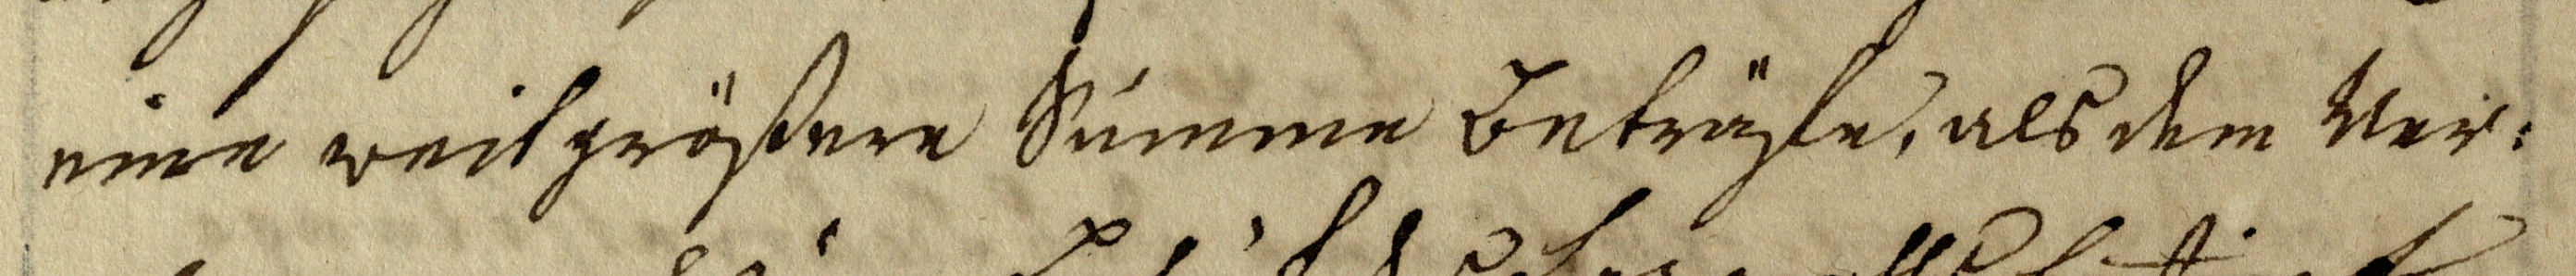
eine weit größere Summe beträfe, als dem Ver¬
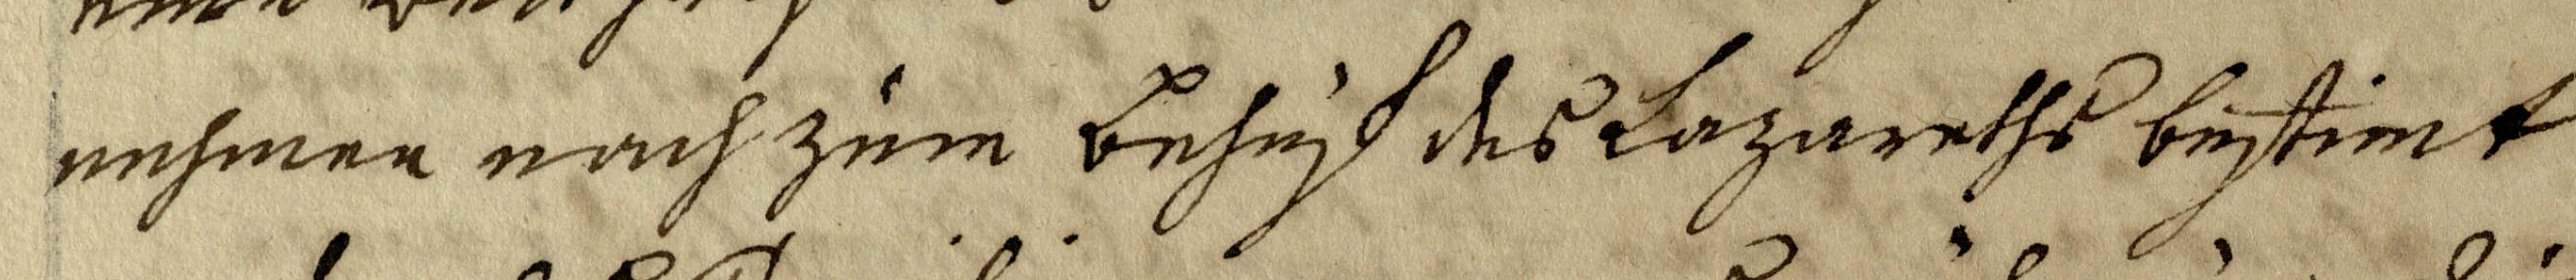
nehmen nach zum Behuf des Lazareths bestimt
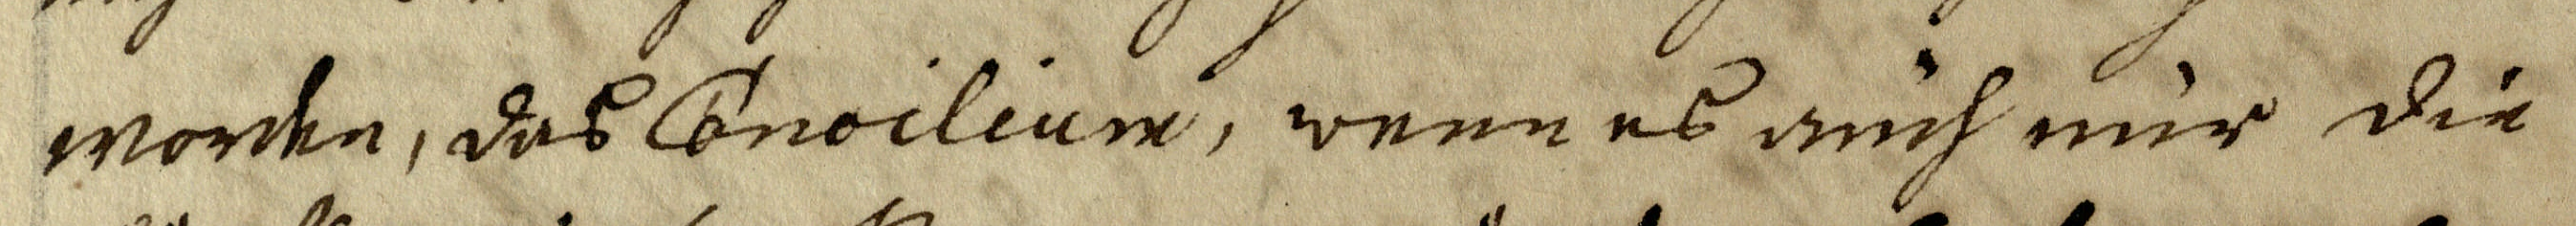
worden, das Concilium, wenn es auch nur die
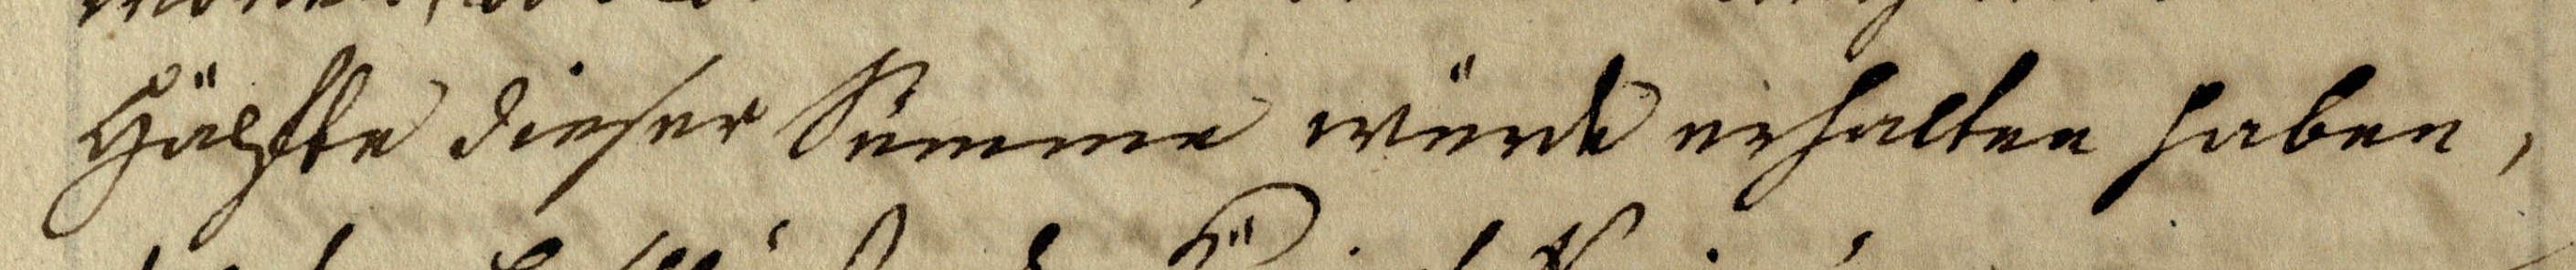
Hälfte dieser Summe würde erhalten haben,
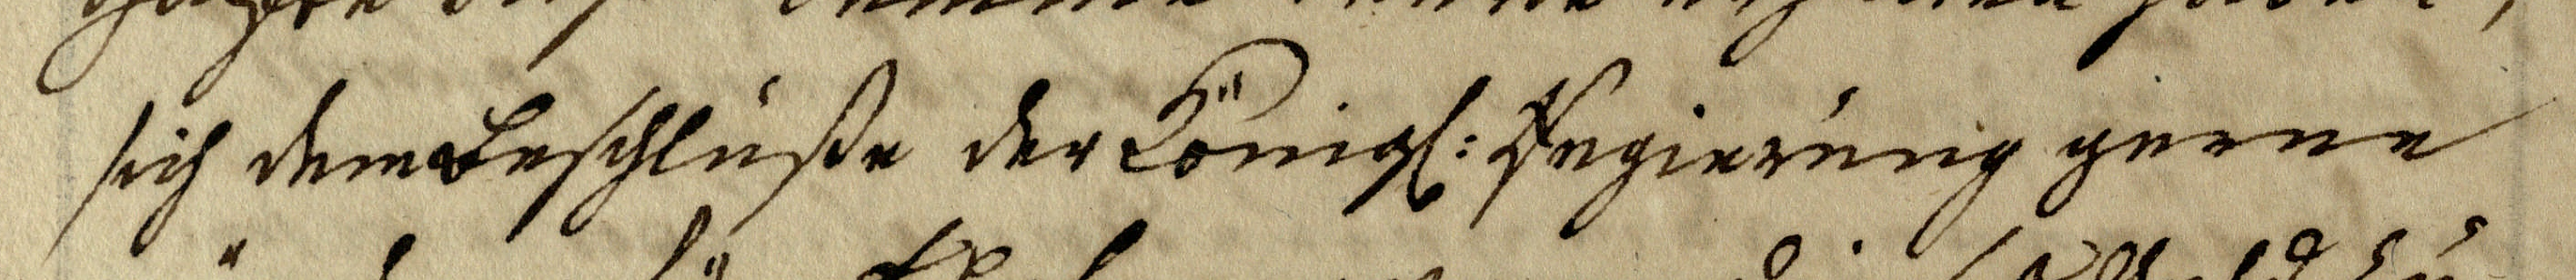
sich dem Beschluße der Königl. Regierung gerne
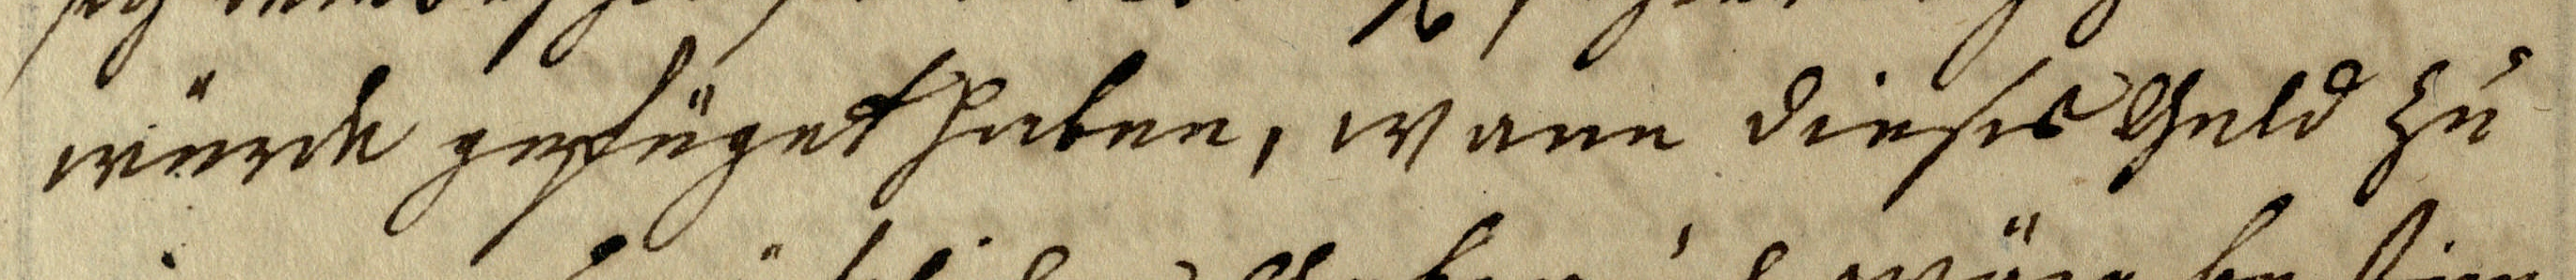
würde gefüget haben, wann dieses Geld zu
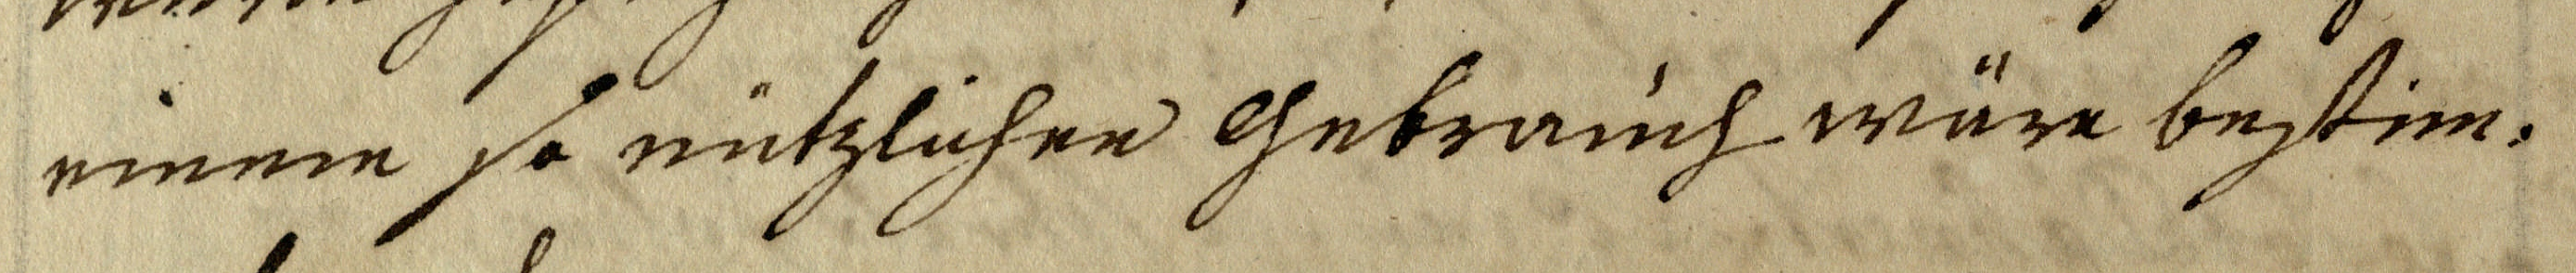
einem so nützlichen Gebrauch wäre bestim¬
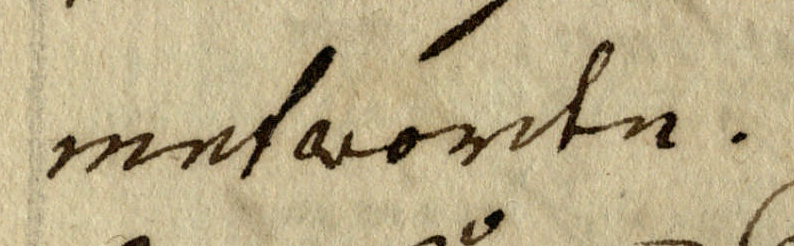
met worden.
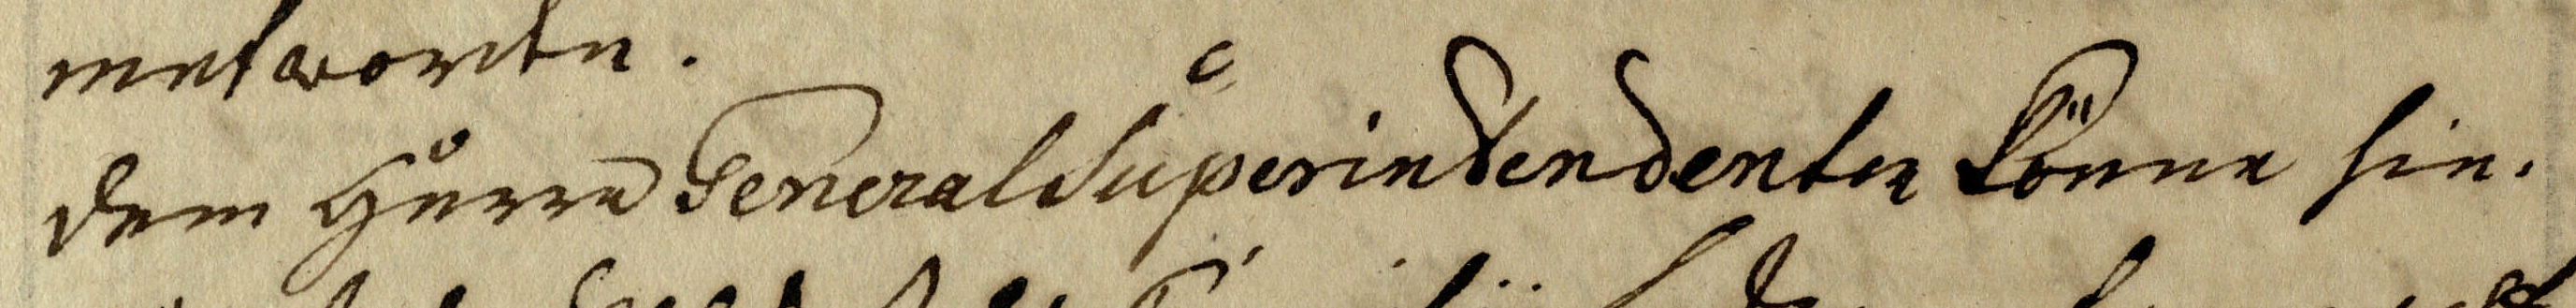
Dem Herrn GeneralSuperintendenten könne hie¬
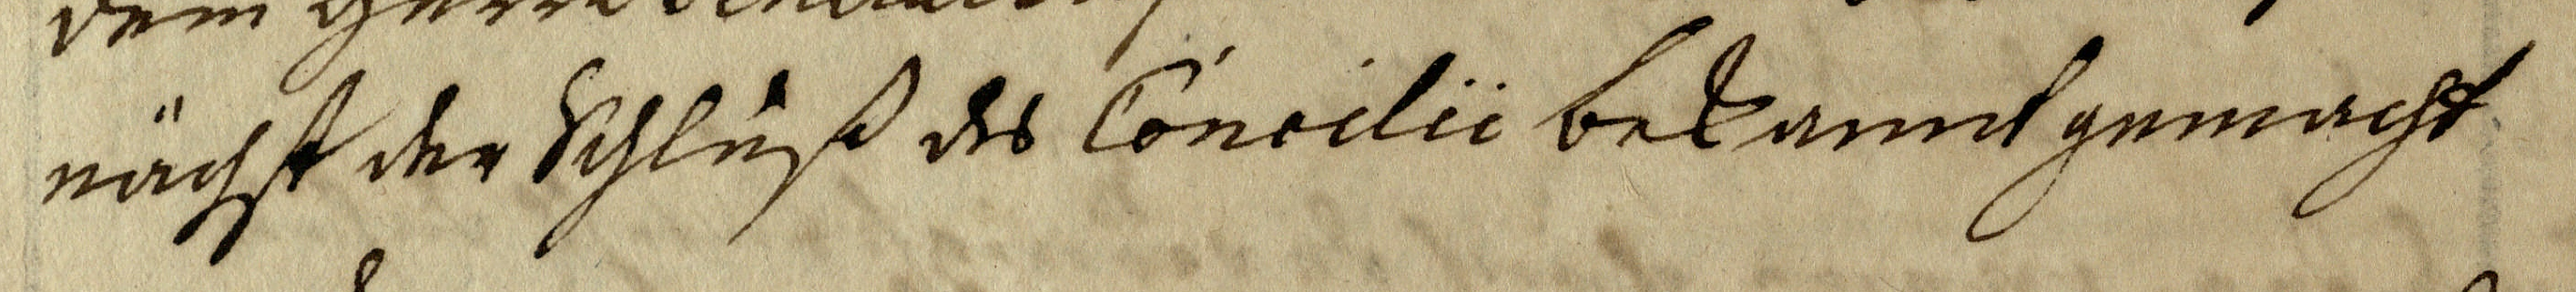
nächst der Schluß des Concilii bekannt gemacht
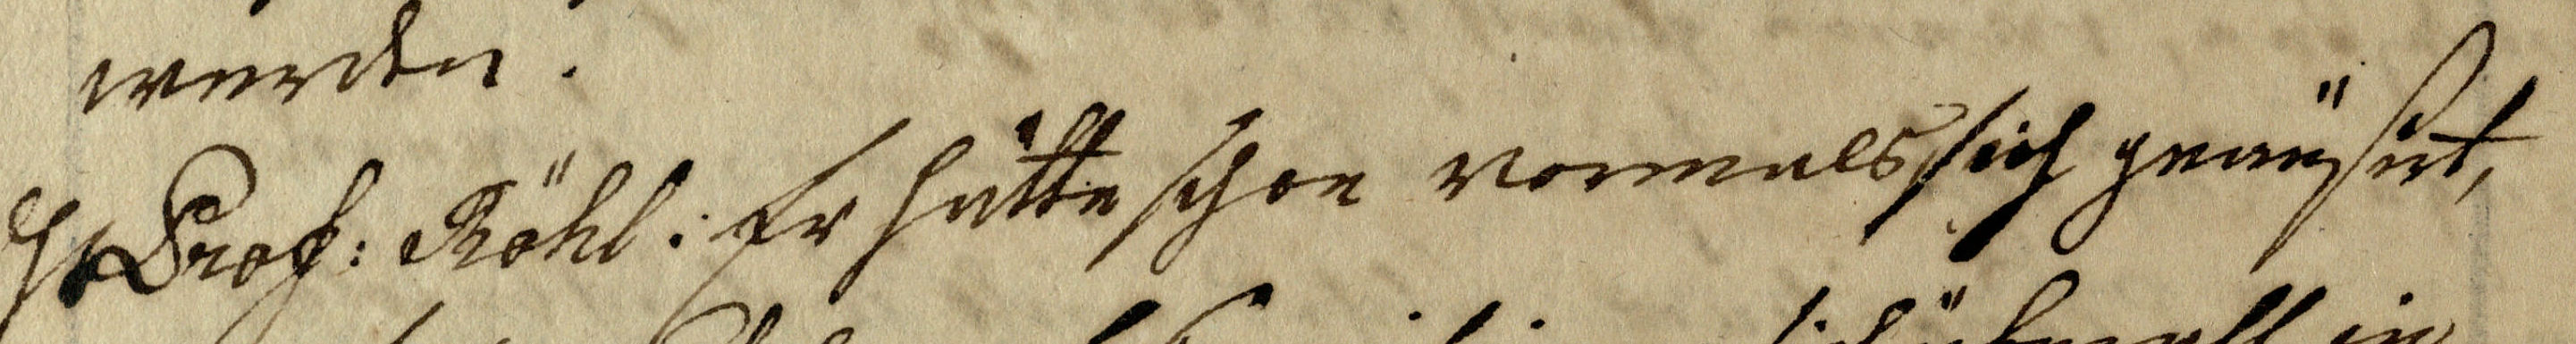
dh. Prof. Röhl. Er hätte schon vormals sich geäußert
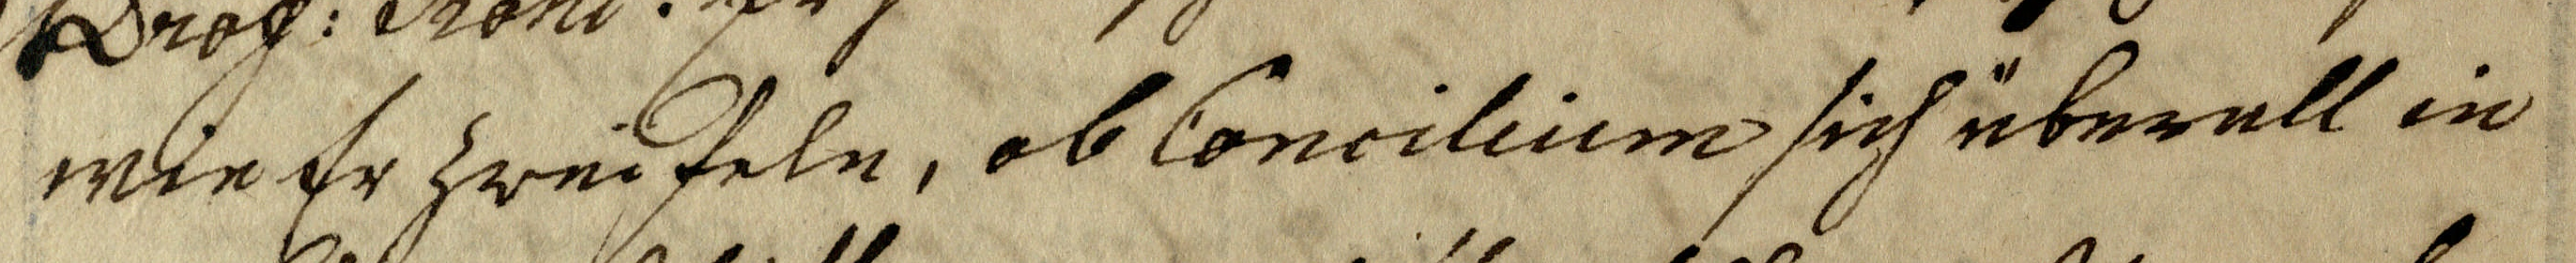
wie Er zweifele, ob Concilium sich überall in
